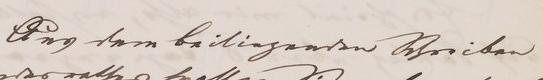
Aus dem beiliegenden Schreiben
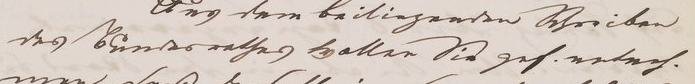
des Bundesrathes wollen Sie gef. entneh-
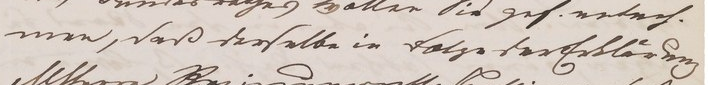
men, daß derselbe in Folge der Erklärung
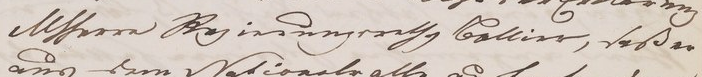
Mhherrn Regierungsraths Bollier, daß er
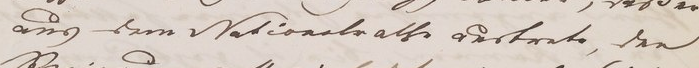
aus dem Nationalrathe austrete, den
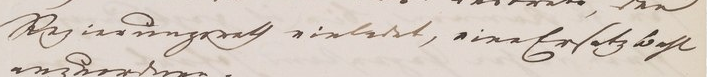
Regierungsrath einladet, eine Ersatzwahl
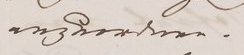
anzuordnen.
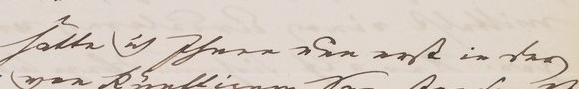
Hätte ich Ihnen nun erst in der
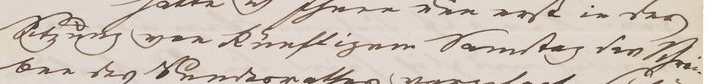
Sitzung von künftigem Samstag das Schrei-
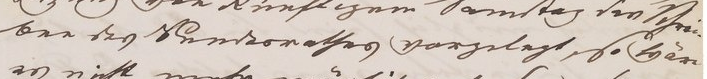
ben des Bundesrathes vorgelegt, so wäre
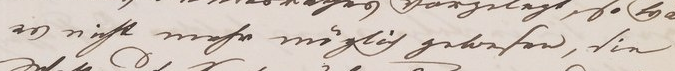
es nicht mehr möglich gewesen, die
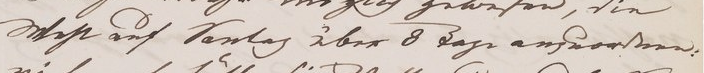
Wahl auf Sontag über 8 Tage anzuordnen,
